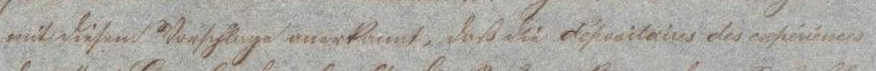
mit diesem Vorschlage anerkannt, daß die dépositaires des expériences
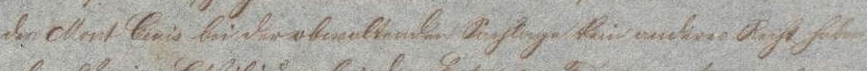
des Mont Cenis bei der obwaltenden Sachlage kein anderes Recht haben
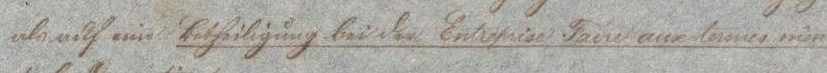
als auf eine Betheiligung bei der Entreprise Favre aux termes mêmes
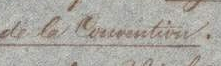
de la Convention.
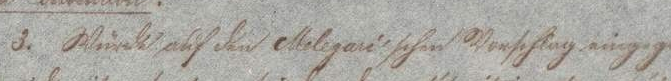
3. Würde auf den Melegari'schen Vorschlag eingegangen,
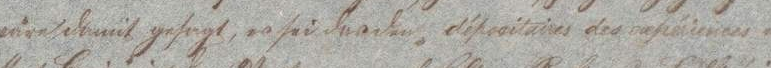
wäre damit gesagt, es sei das den dépositaires des expériences des
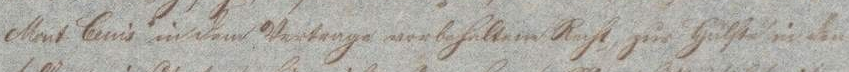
Mont Cenis in dem Vertrage vorbehaltene Recht, zur Hälfte in den-
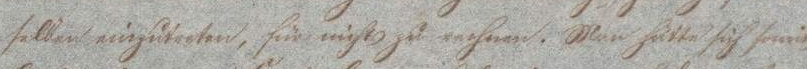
selben einzutreten, für nichts zu rechnen. Man hätte sich somit
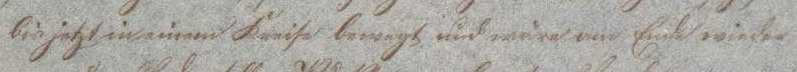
bis jetzt in einem Kreise bewegt und wäre am Ende wieder
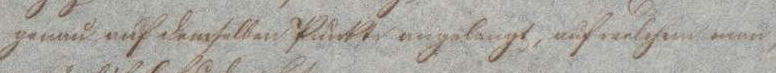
genau auf demselben Punkte angelangt, auf welchem man sich
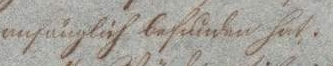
anfänglich befunden hat.
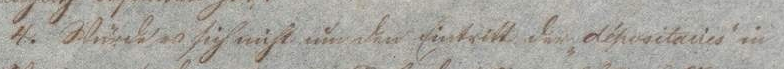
4. Würde es sich nicht um den Eintritt der «dépositaires» in
